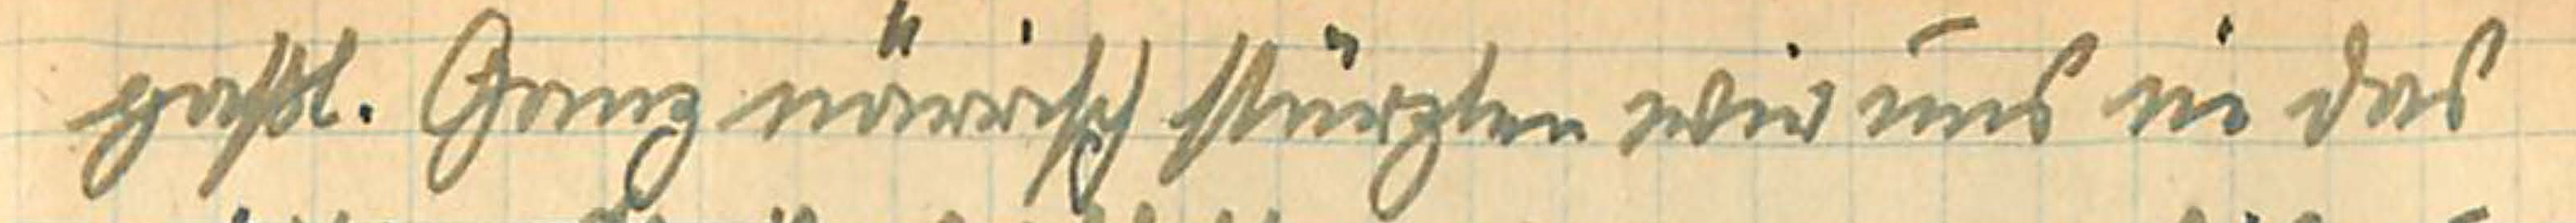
paßt. Ganz närrisch stürzten wir uns in das
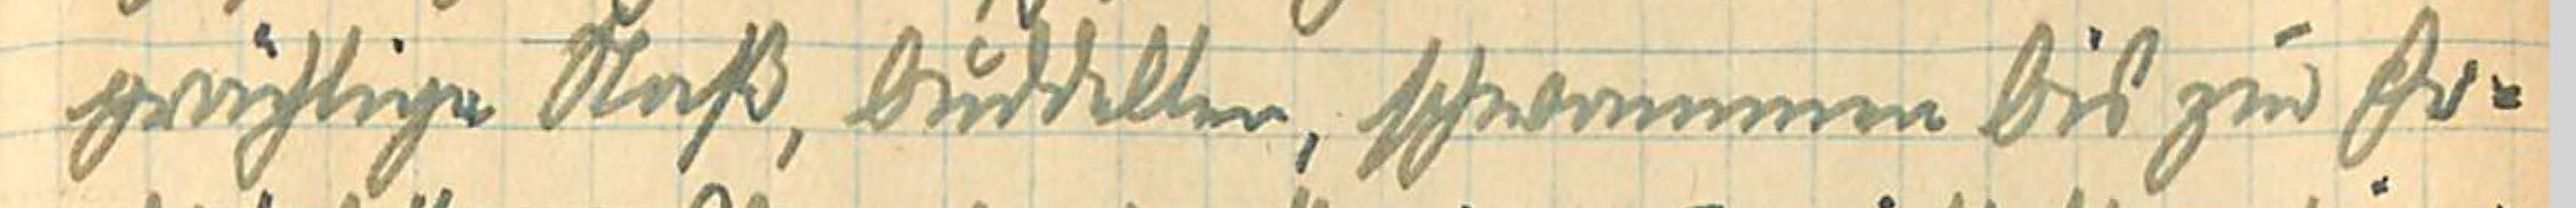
prächtige Naß, buddelten, schwammen bis zur Er-
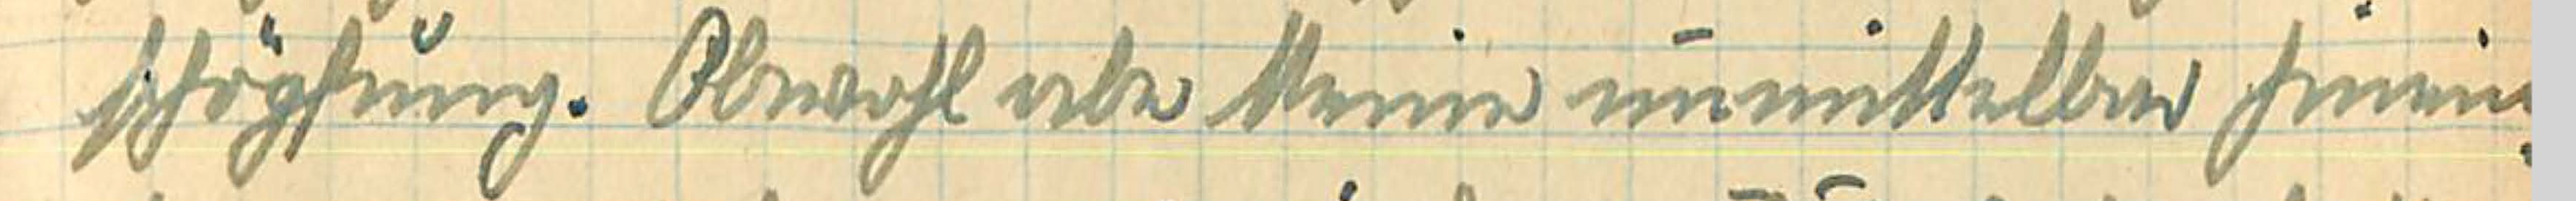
schöpfung. Obwohl aber keiner unmittelbar hinein-
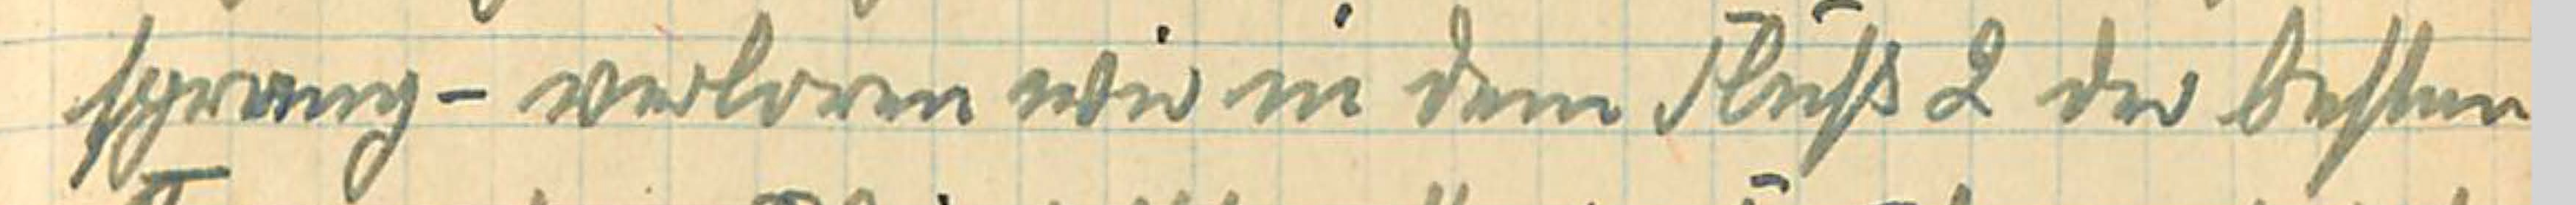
sprang - verloren wir in dem Fluß 2 der besten
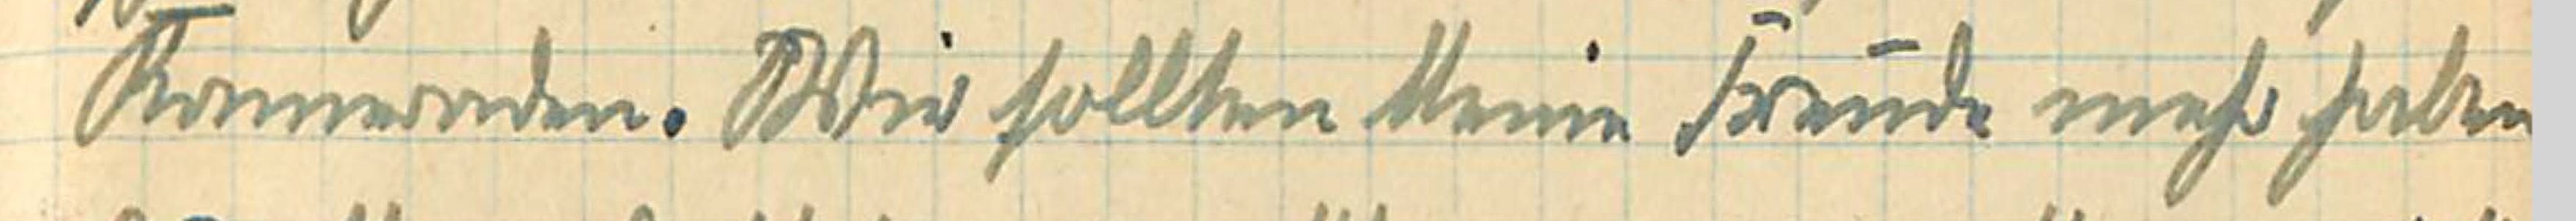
Kameraden. Wir sollten keine Freude mehr haben.
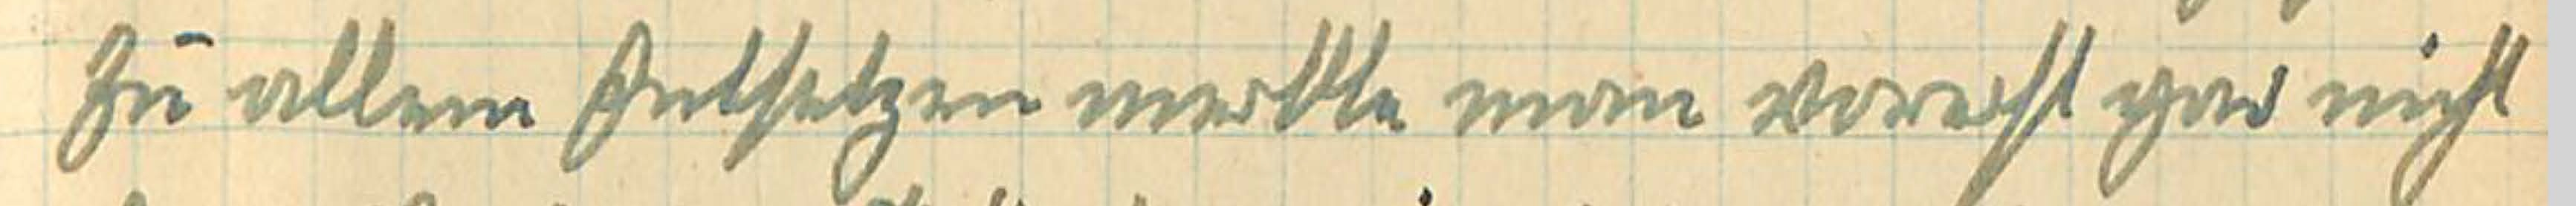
Zu allem Entsetzen merkte man vorerst gar nicht
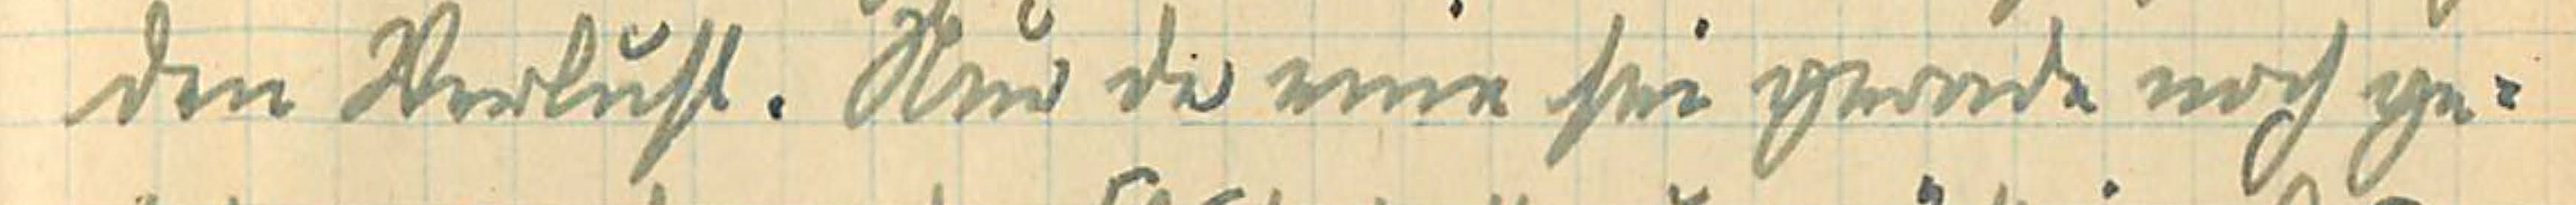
den Verlust. Nur der eine sei gerade noch ge-
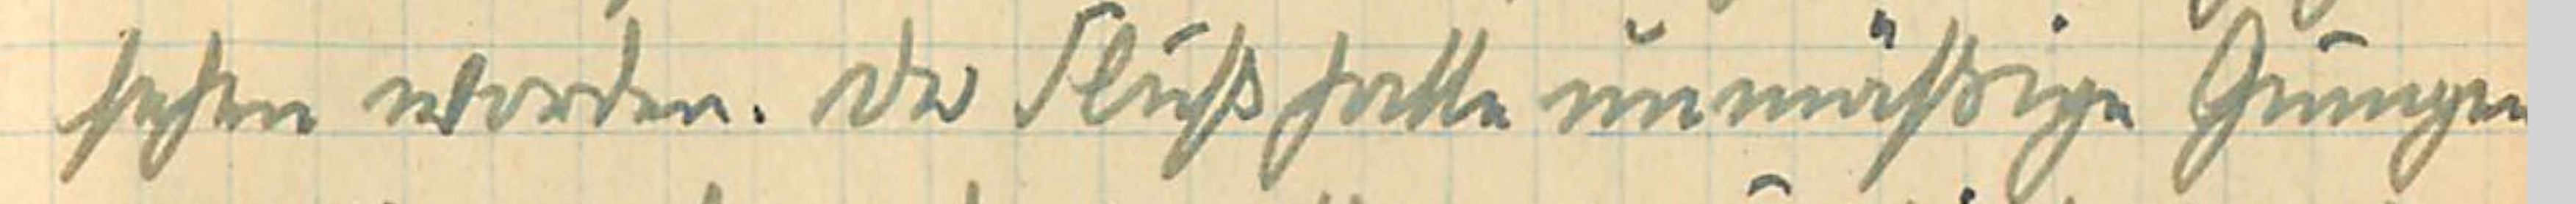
sehen worden. Der Fluß hatte unmäßige Gumpen
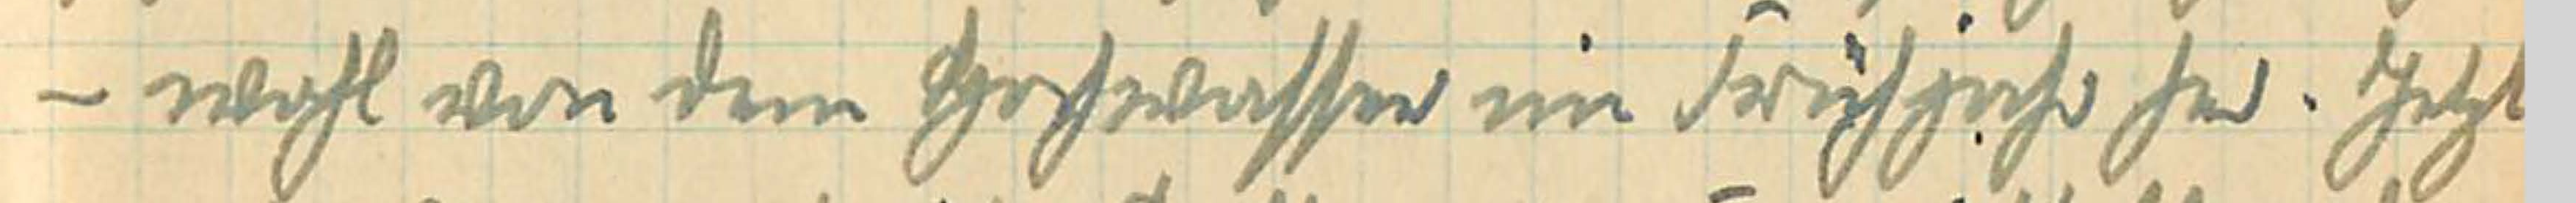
– wohl von dem Hochwasser im Frühjahr her. Jetzt
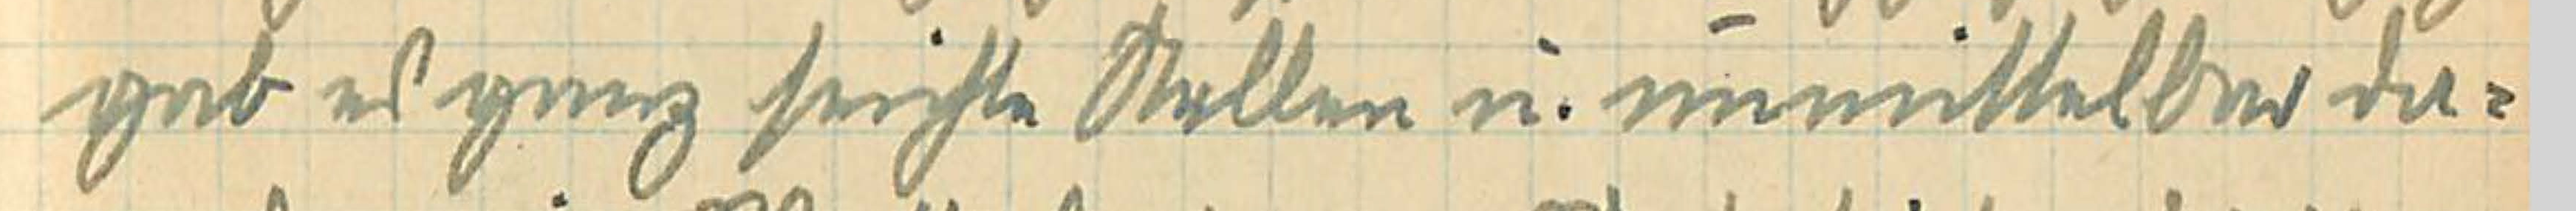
gab es ganz seichte Stellen u. unmittelbar da-
